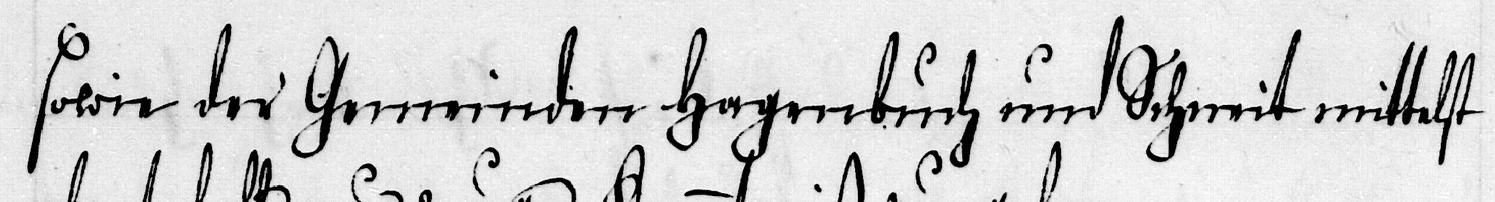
sowie der Gemeinden Hagenbuch und Schneit mitt¬
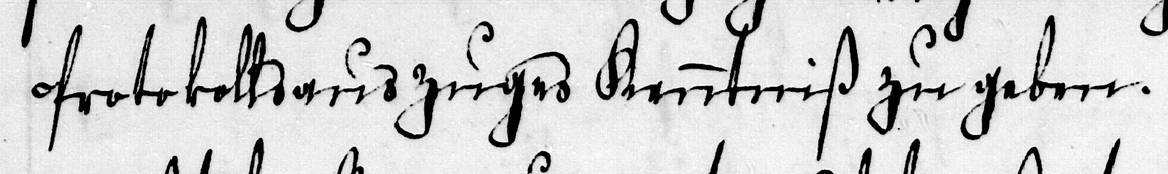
Protokollsauszuges Kenntniß zu geben.
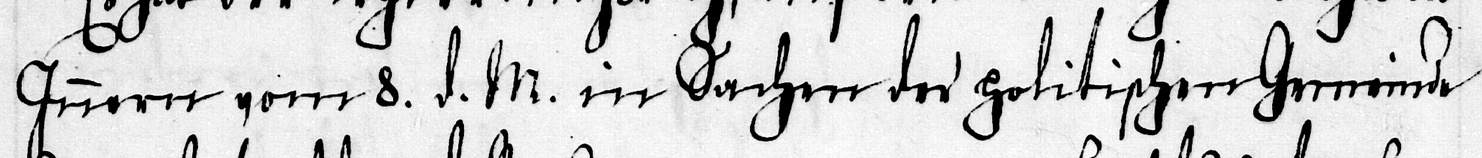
Innern vom 8. d. M. in Sachen der politischen Gemeinde
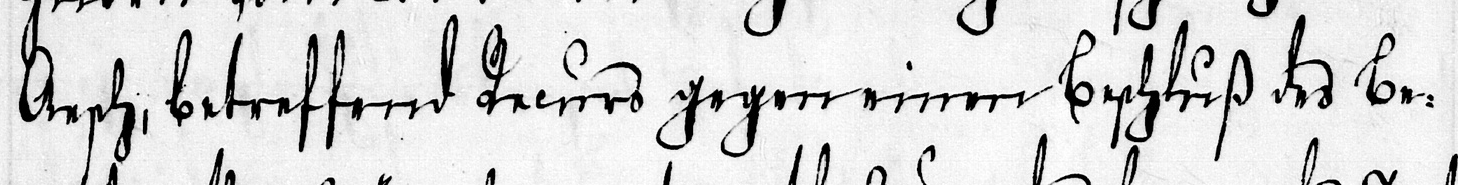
Aesch, betreffend Recurs gegen einen Beschluß des Bez¬
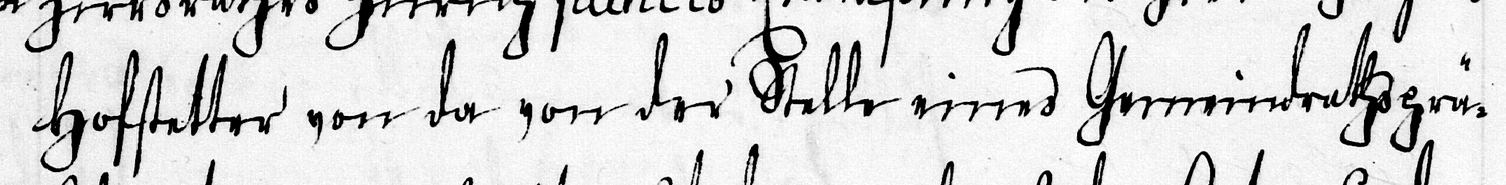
Hofstetter von da von der Stelle eines Gemeindrathsprä¬
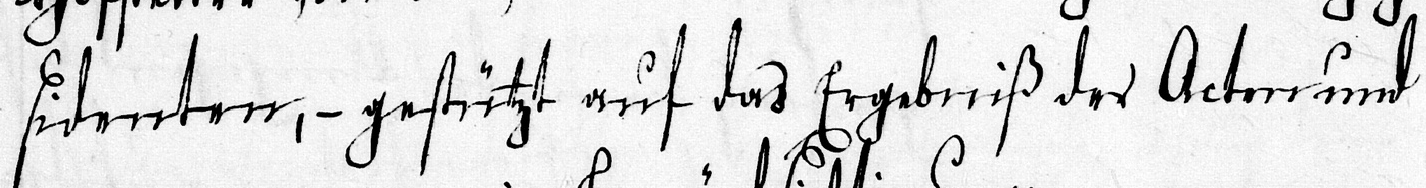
sidenten, – gestützt auf das Ergebniß der Acten und
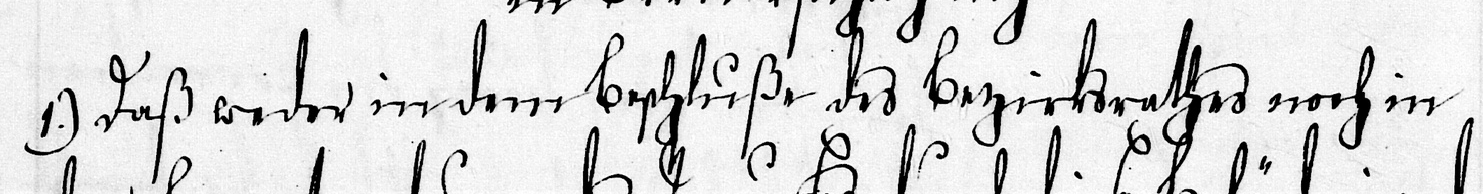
1.) Daß weder in dem Beschluße des Bezirksrathes noch in
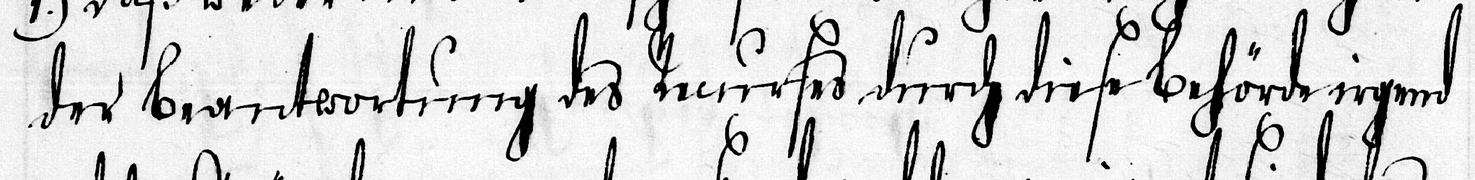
der Beantwortung des Recurses durch diese Behörde
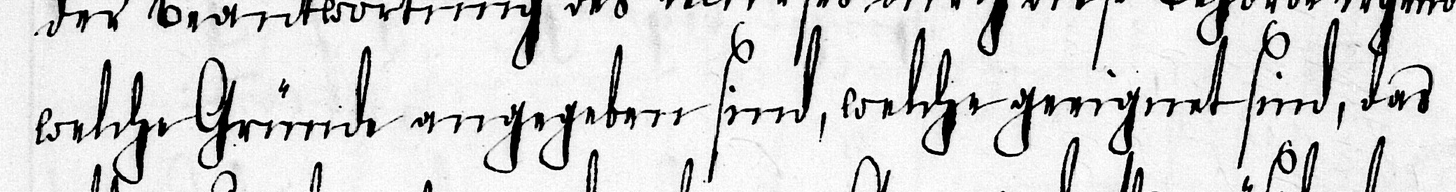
welche Gründe angegeben sind, welche geeignet sind, das
